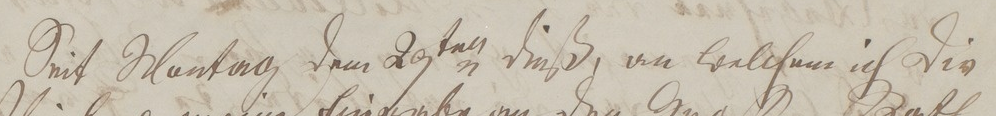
Seit Montag dem 29ten dieß, an welchem ich Dir
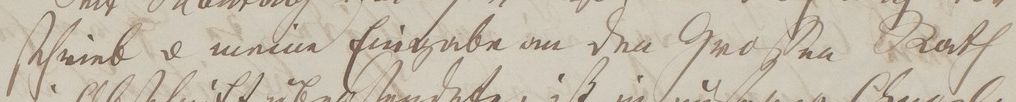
schrieb & meine Eingabe an den Grossen Rath
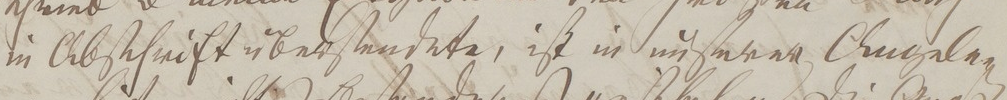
in Abschrift übersendete, ist in unserer Angele-
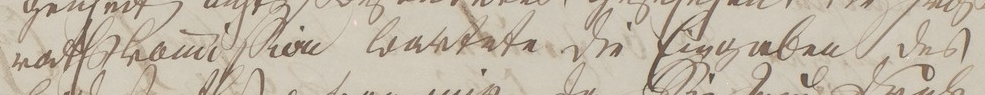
rathskommission wartete die Eingaben des
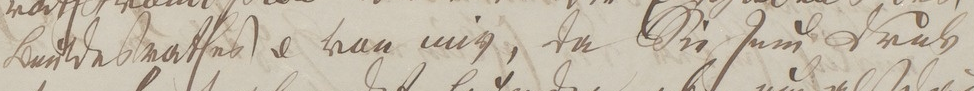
Bundesrathes & von mir, da Sie zum Druk
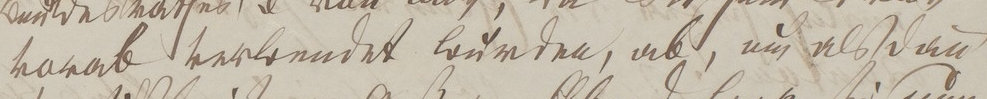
vorab verwendet wurden, ab, um alsdann
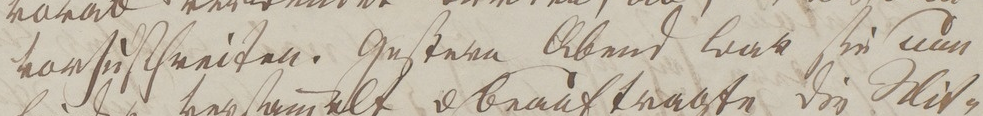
vorzuschreiten. Gestern Abend war sie nun
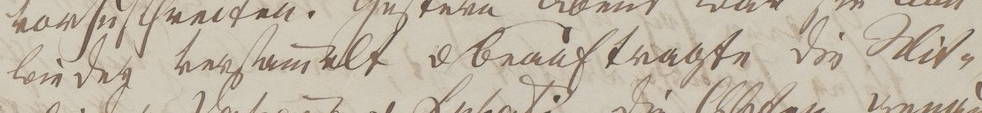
wieder versammelt & beauftragte die Mit-
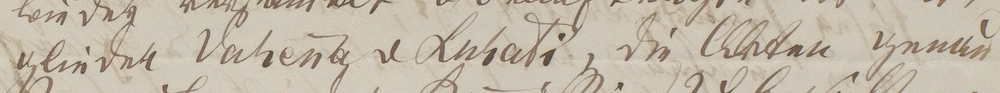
glieder Varenna & Lurati, die Akten genau
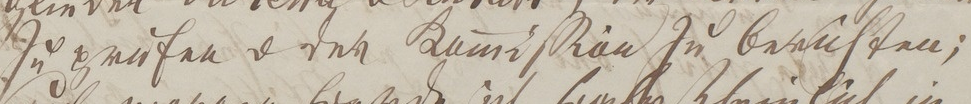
zu prüfen & der Kommission zu berichten;
